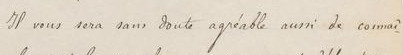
Il vous sera sans doute agréable aussi de connaî-
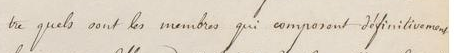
tre quels sont les membres qui composent définitivement
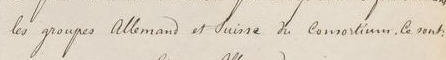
les groupes Allemand et Suisse du Consortium. Ce sont:
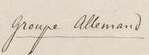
Groupe Allemand
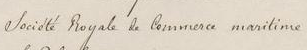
Société Royale de Commerce maritime "
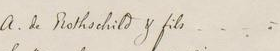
A. de Rothschild & fils à
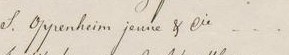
S. Oppenheim jeune & Cie
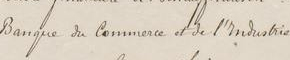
Banque du Commerce et de l'Industrie
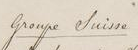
Groupe Suisse
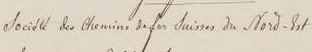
Société des Chemins de fer Suisses du Nord-Est
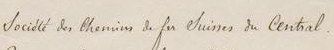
Société des Chemins de fer Suisses du Central
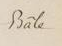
Bâle
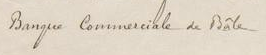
Banque Commerciale de Bâle "
